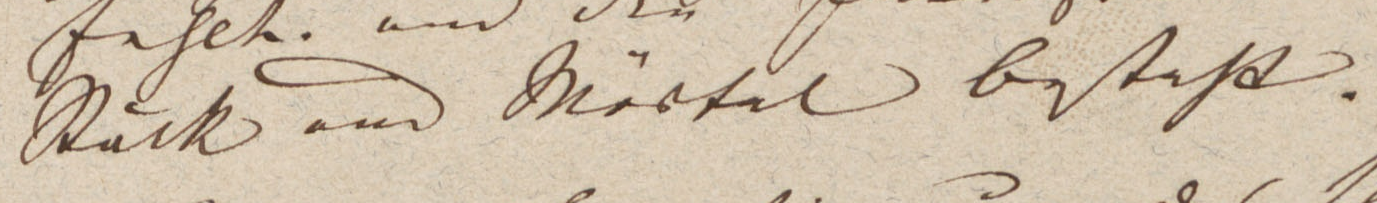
Stuck und Mörtel besteht.
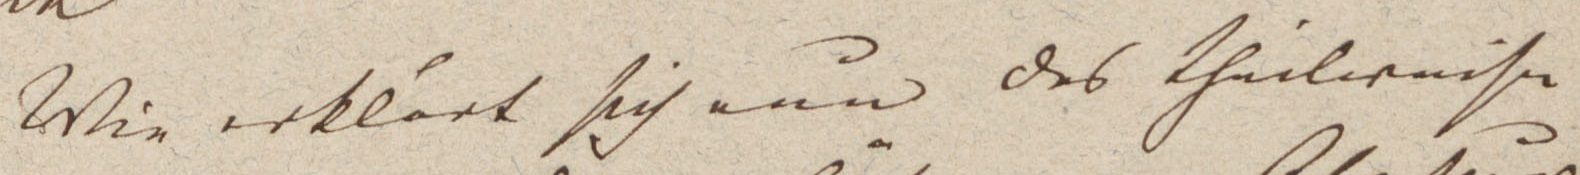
Wie erklärt sich nun das theilweise
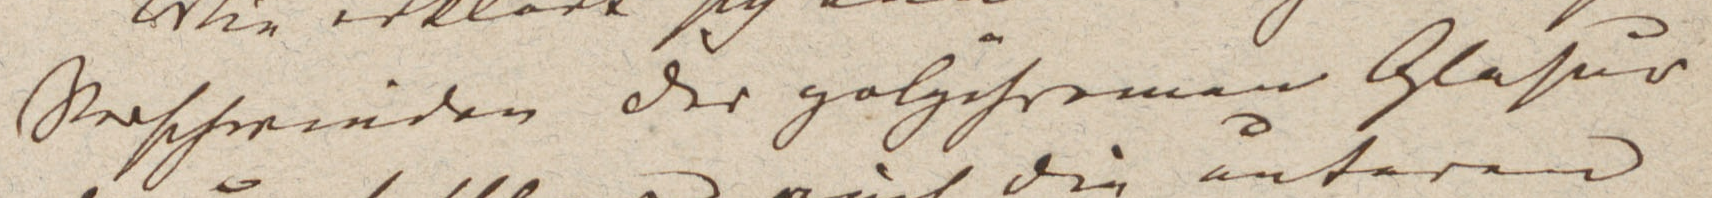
Verschwinden der polychromen Glasur
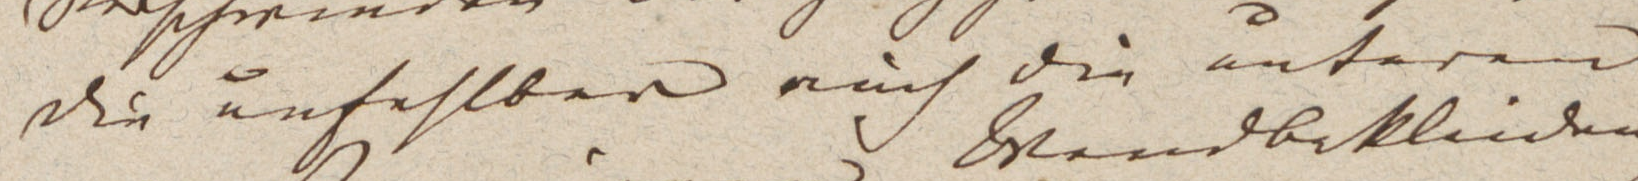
die unfehlbar auch die unteren
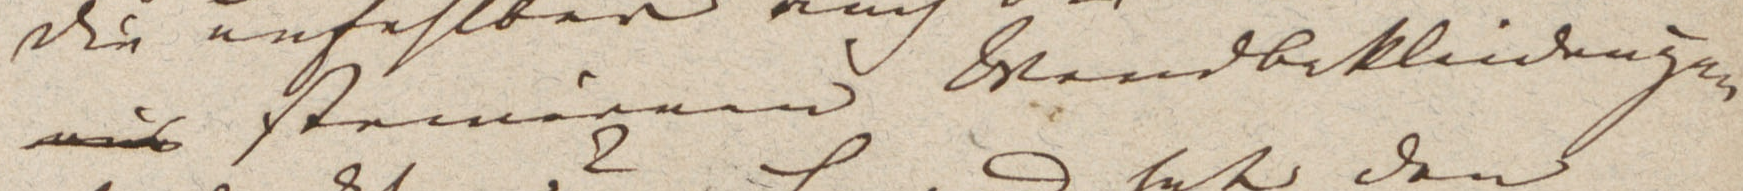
aus steinernen Wandbekleidungen
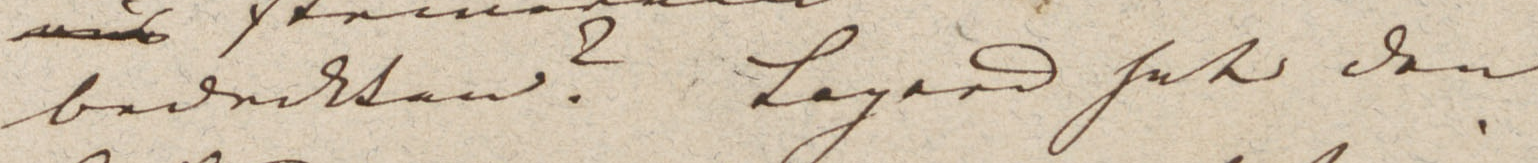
bedeckten? Layard hat den
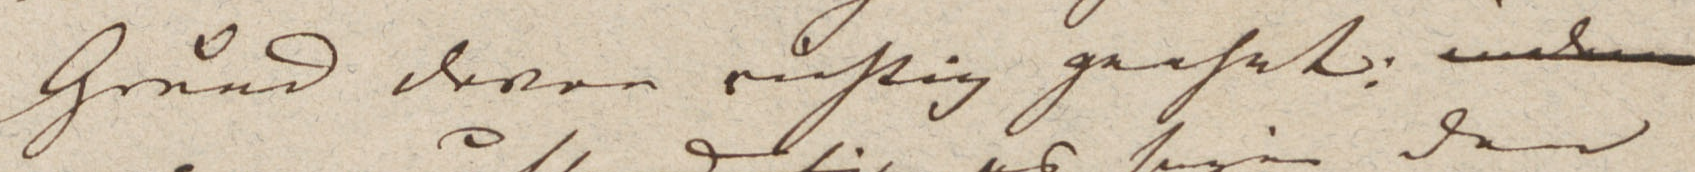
Grund davon richtig geahnt: indem
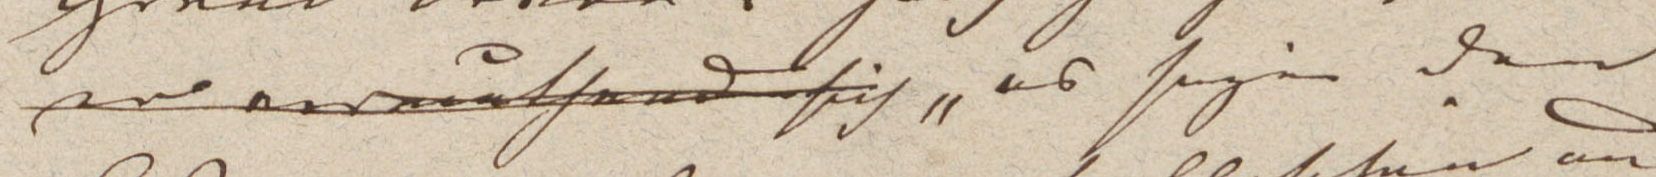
er vermuthend sich "es seyen den
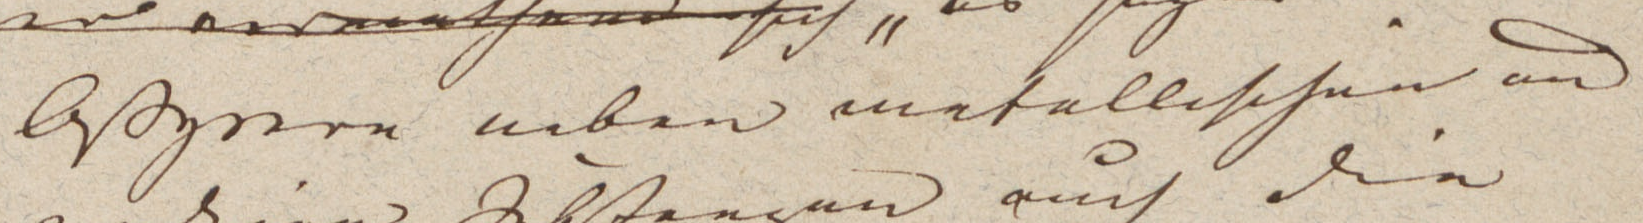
"Assyrern neben metallischen und
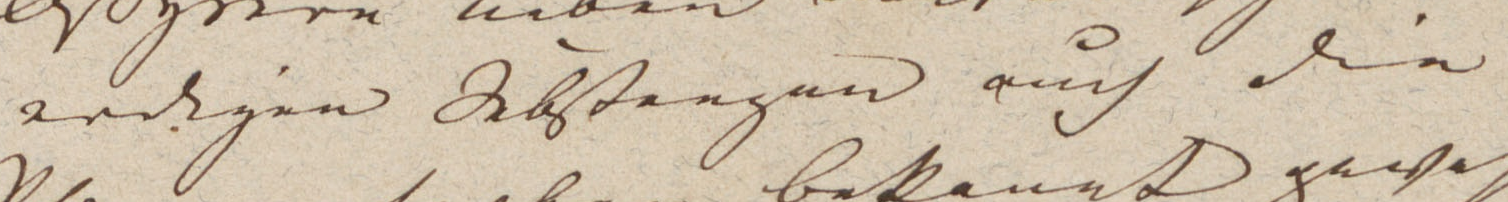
"erdigen Substanzen auch die
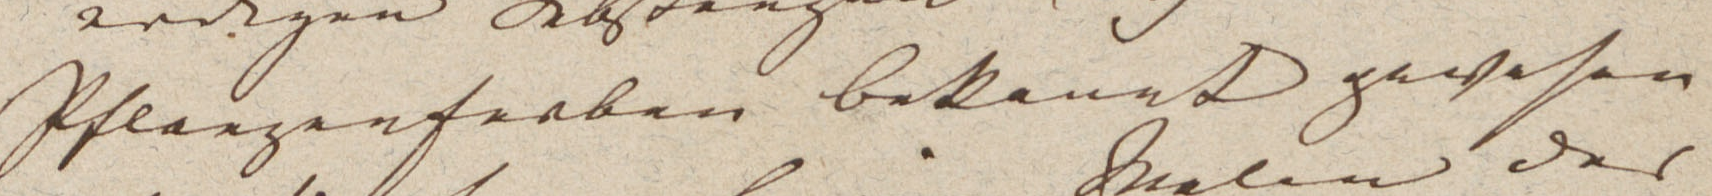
"Pflanzenfarben bekannt gewesen
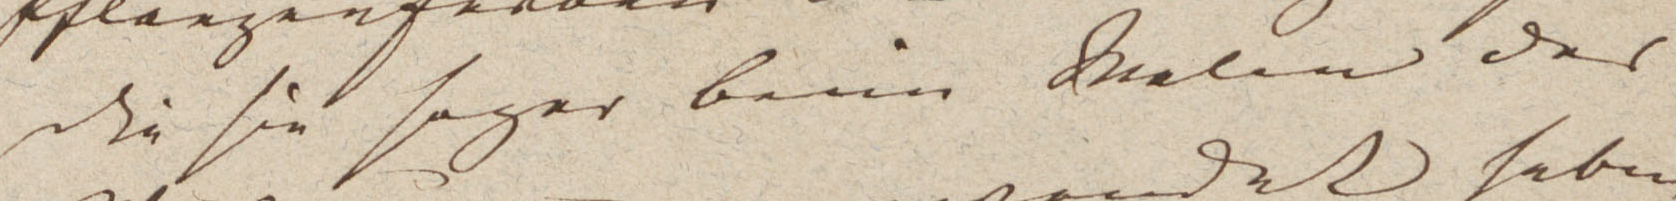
"die sie sogar beim Malen der
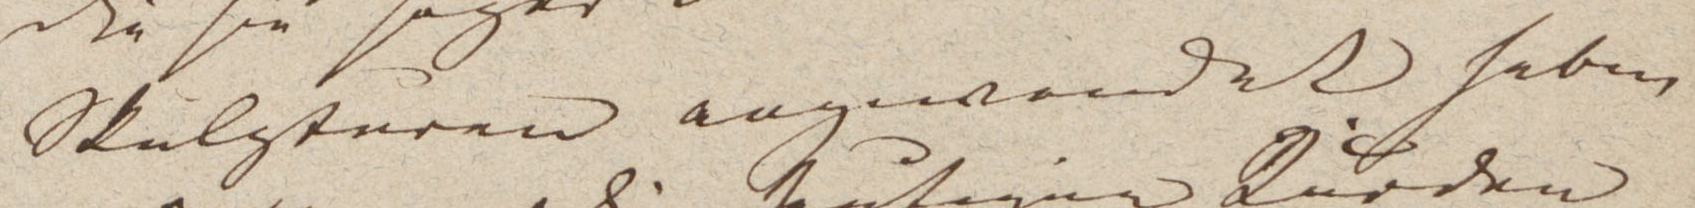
"Skulpturen angewendet haben
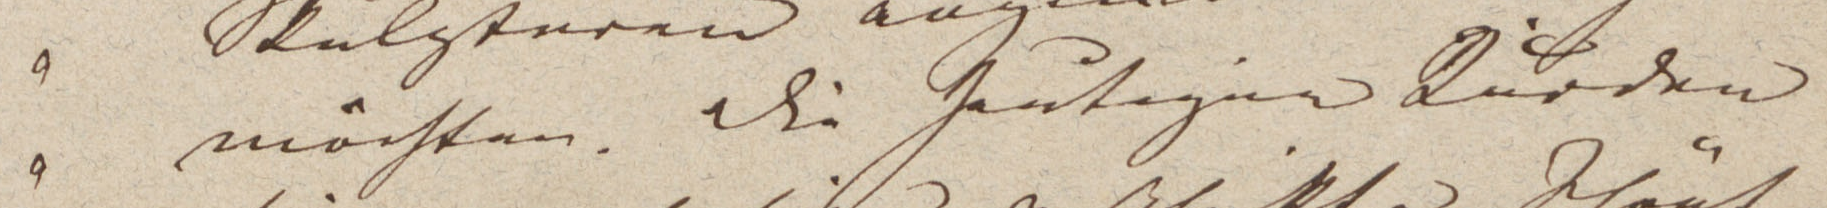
"möchten. Die heutigen Kurden
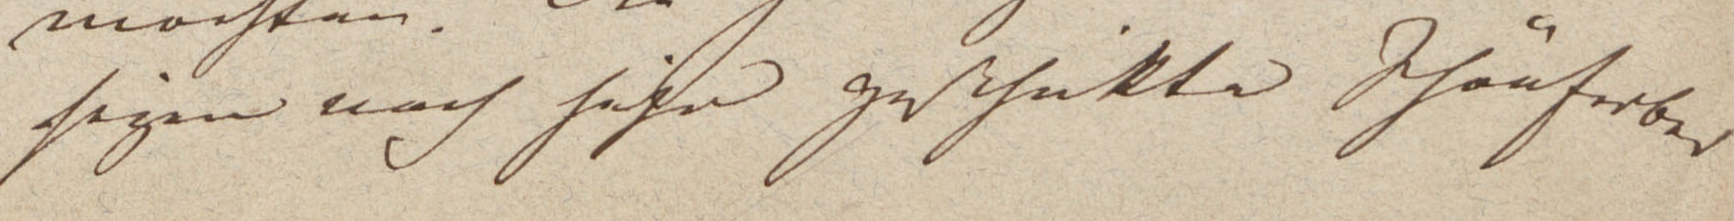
"seyen noch sehr geschickte Schönfarber
